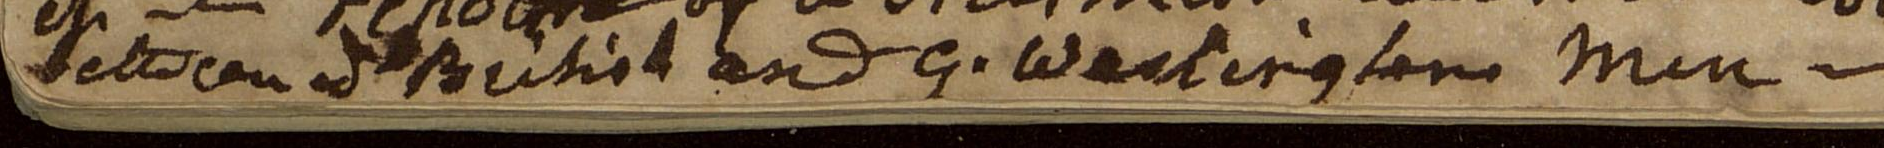between y^e British and G. Washingtons men-
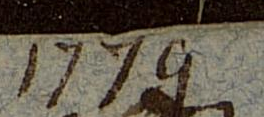1779
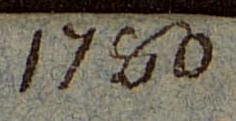1780
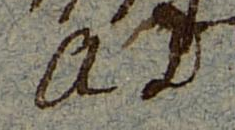A D
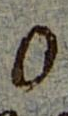0
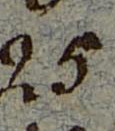25
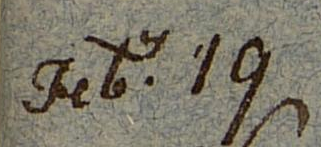Feb^y. 19
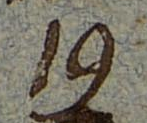19
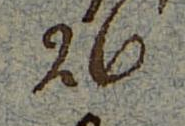26
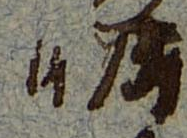14 15
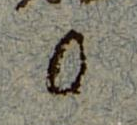0
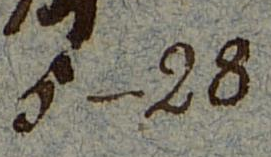5-28
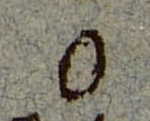O
